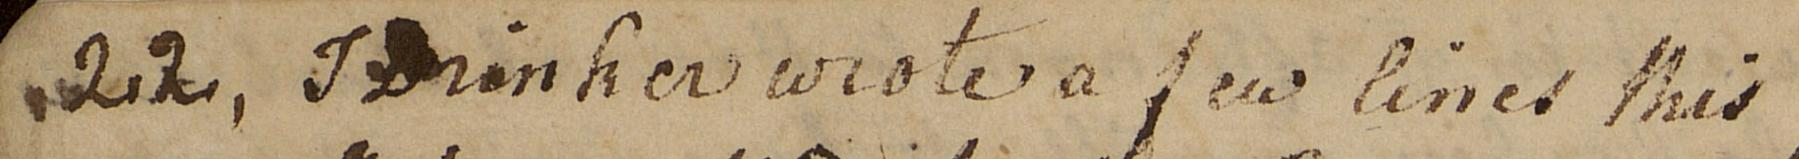22, I Drinker wrote a few lines this
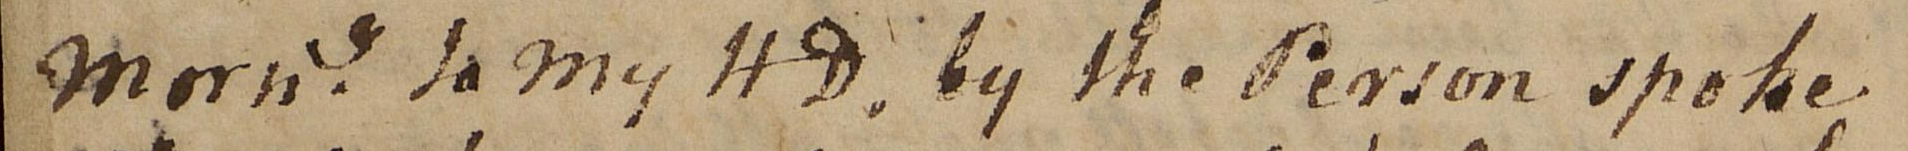morn^g. To my HD, by the Person spoke
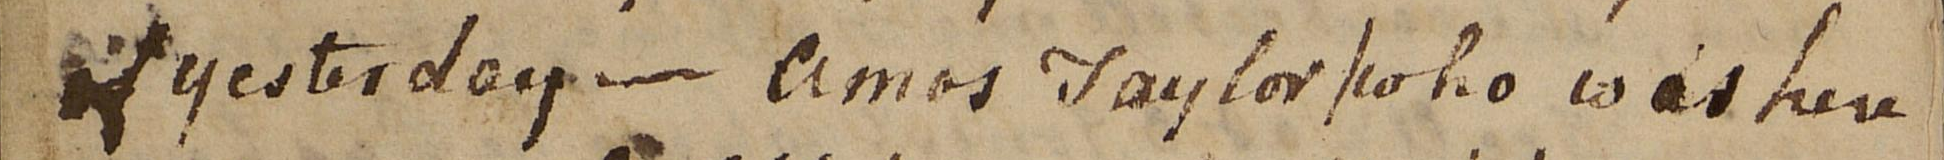of yesterday- Amos Taylor /who was here
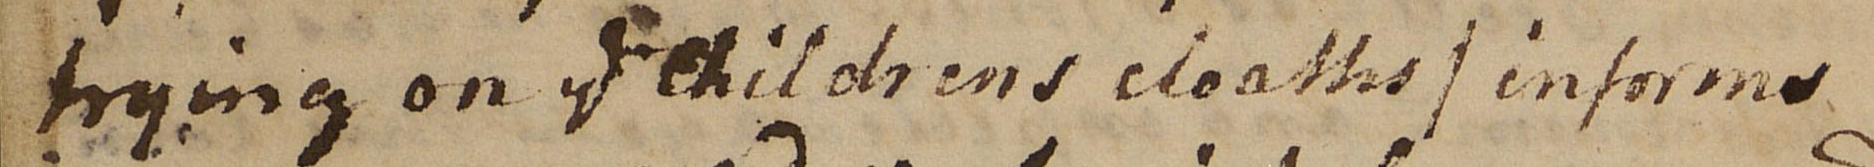trying on y^e Childrens cloaths/ informs
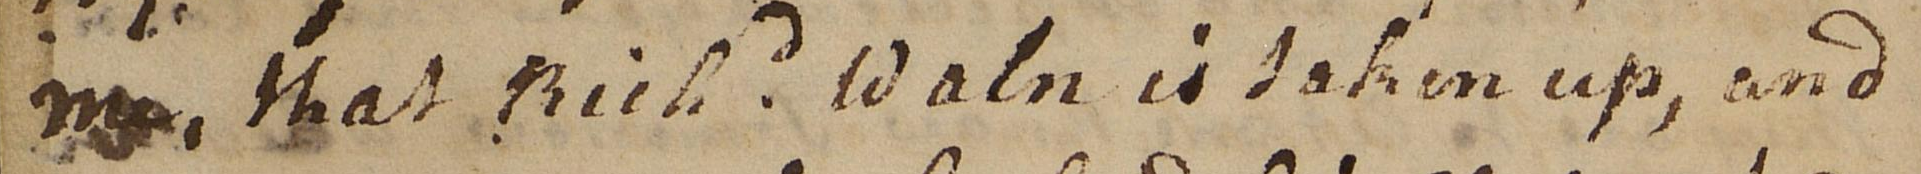[me], that Rich^d. Waln is taken up, and
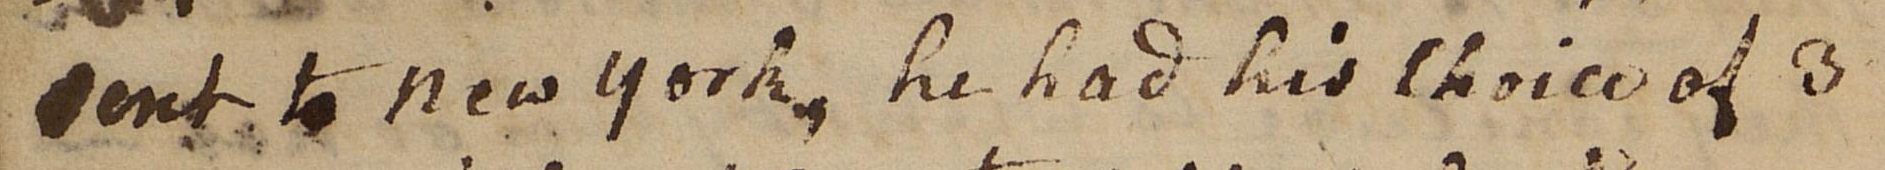sent to New York, he had his Choice of 3
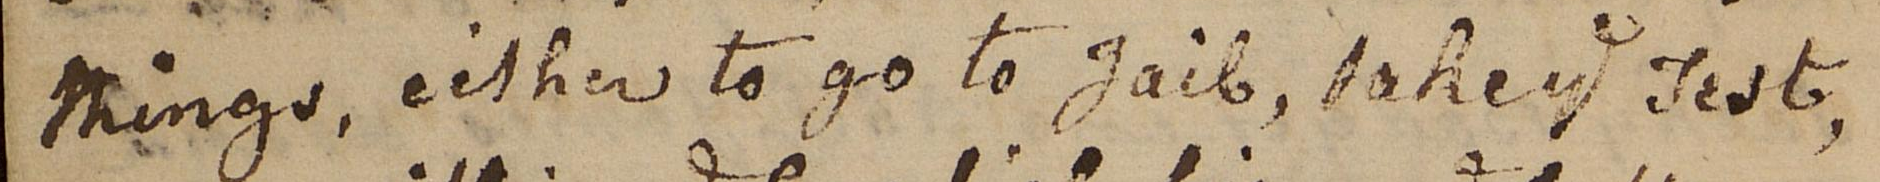things, either to go to Jail, take y^e Test,
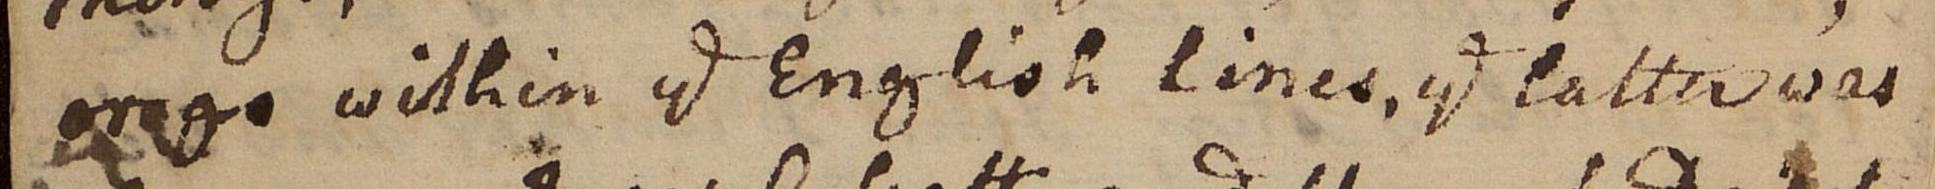[or go] within y^e English lines, y^e latter was
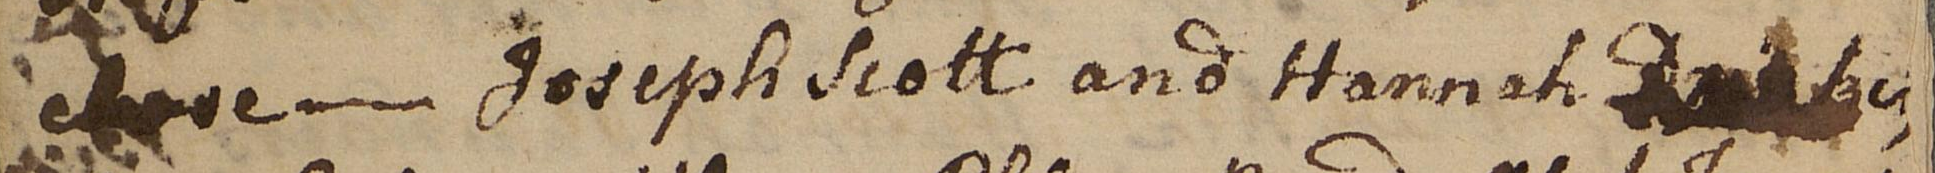[chose] - Joseph Scott and Hannah Drinker
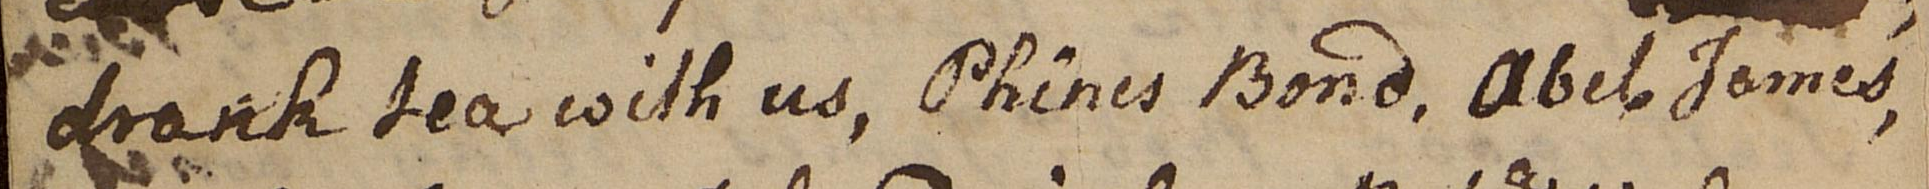drank tea with us, Phines Bond, Abel James,
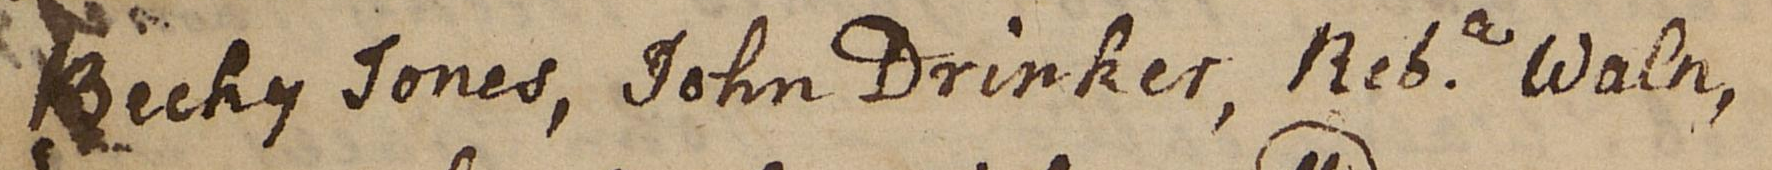Becky Jones, John Drinker, Reb^a. Waln,
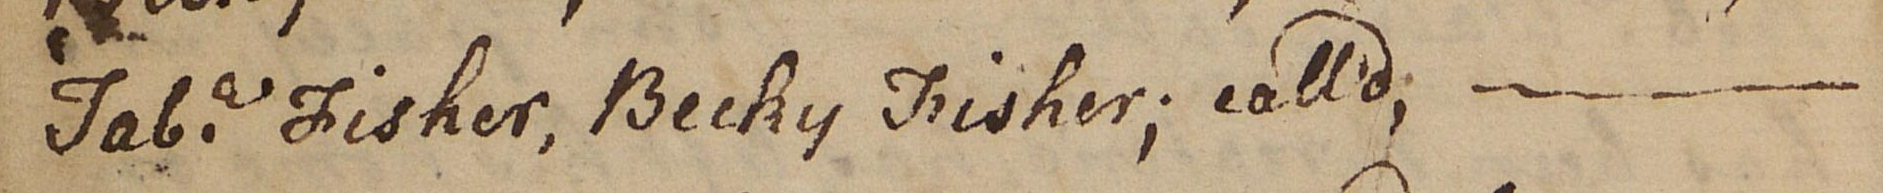Sal^a. Fisher, Becky Fisher; call'd,-
